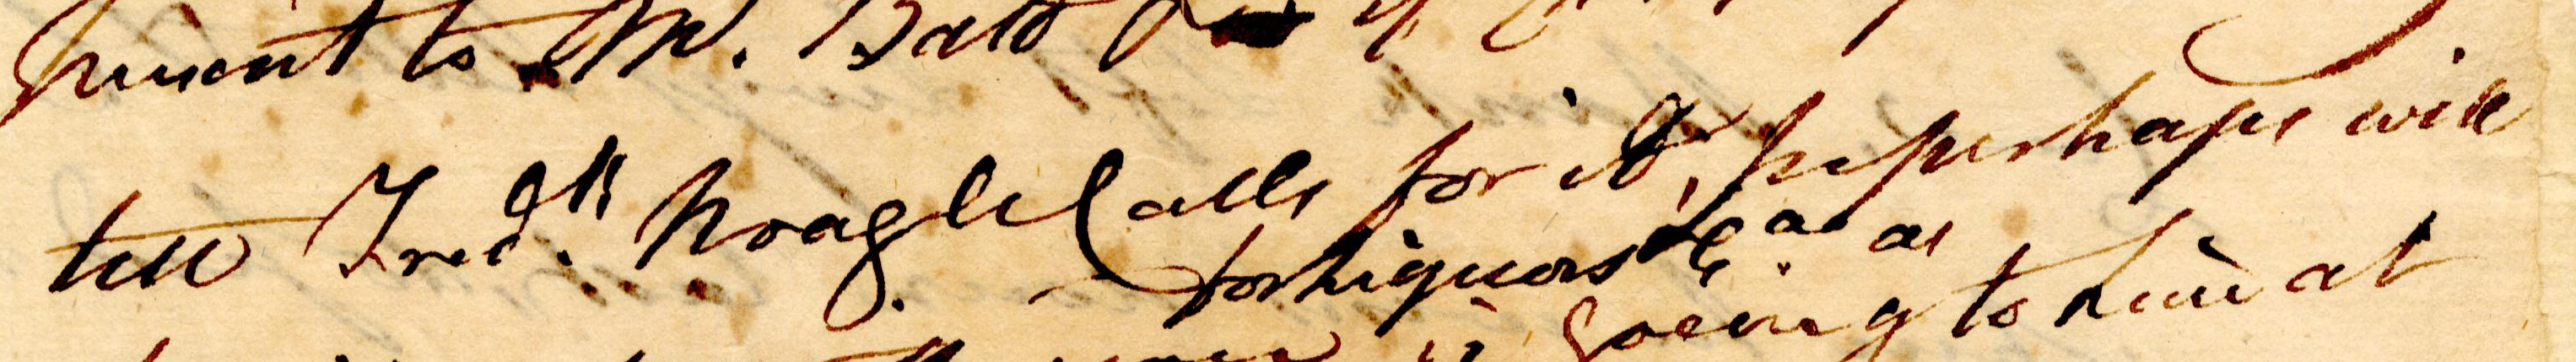tell Fred^k. Noagle Calls for it, perhaps will
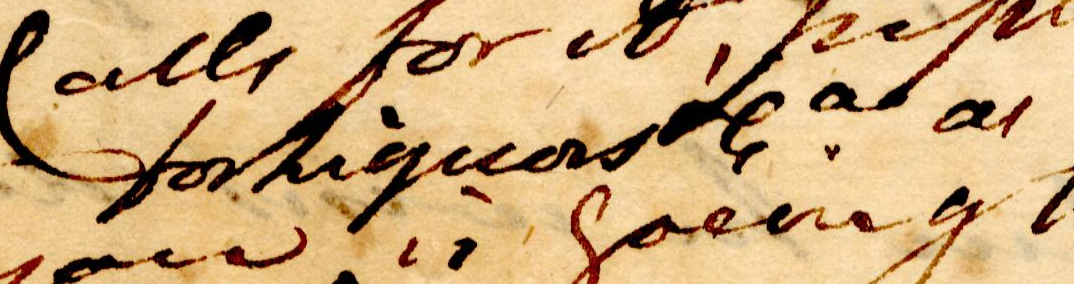for Liquors &C^a as
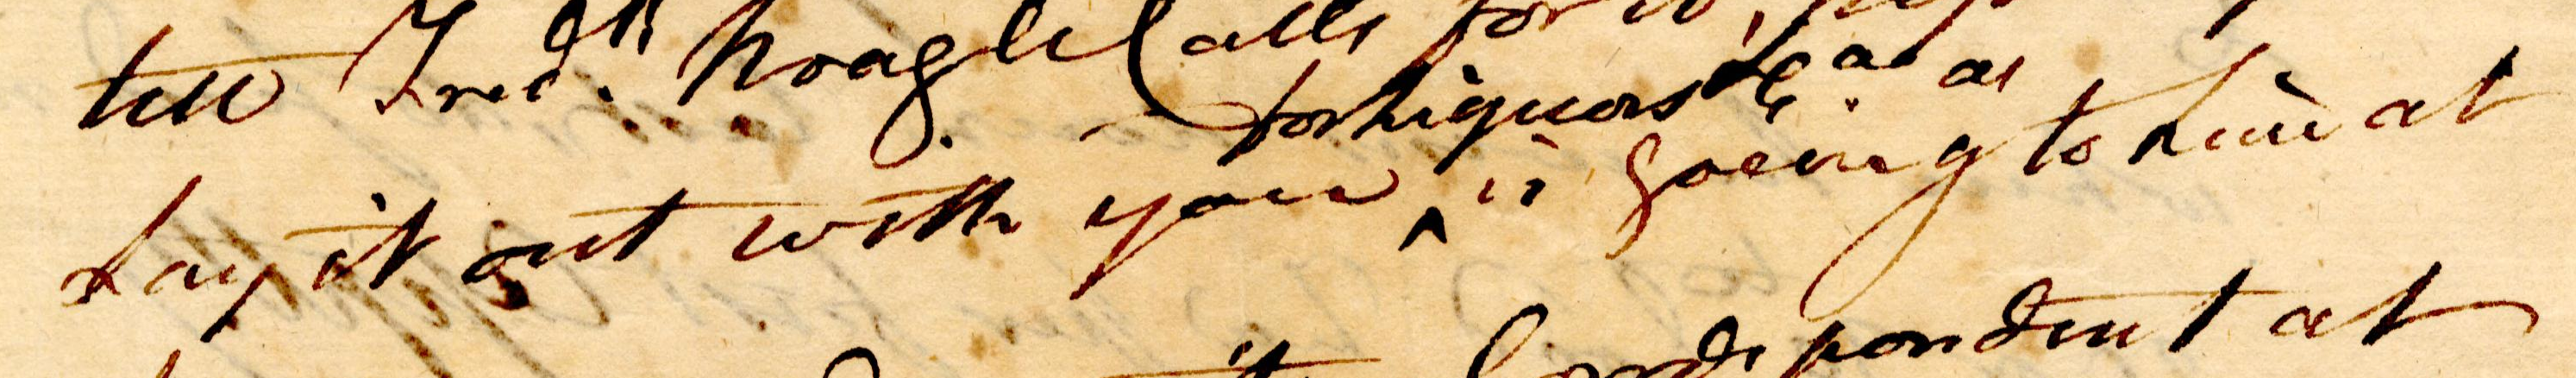Lay it out with you ^ is goeing to live at
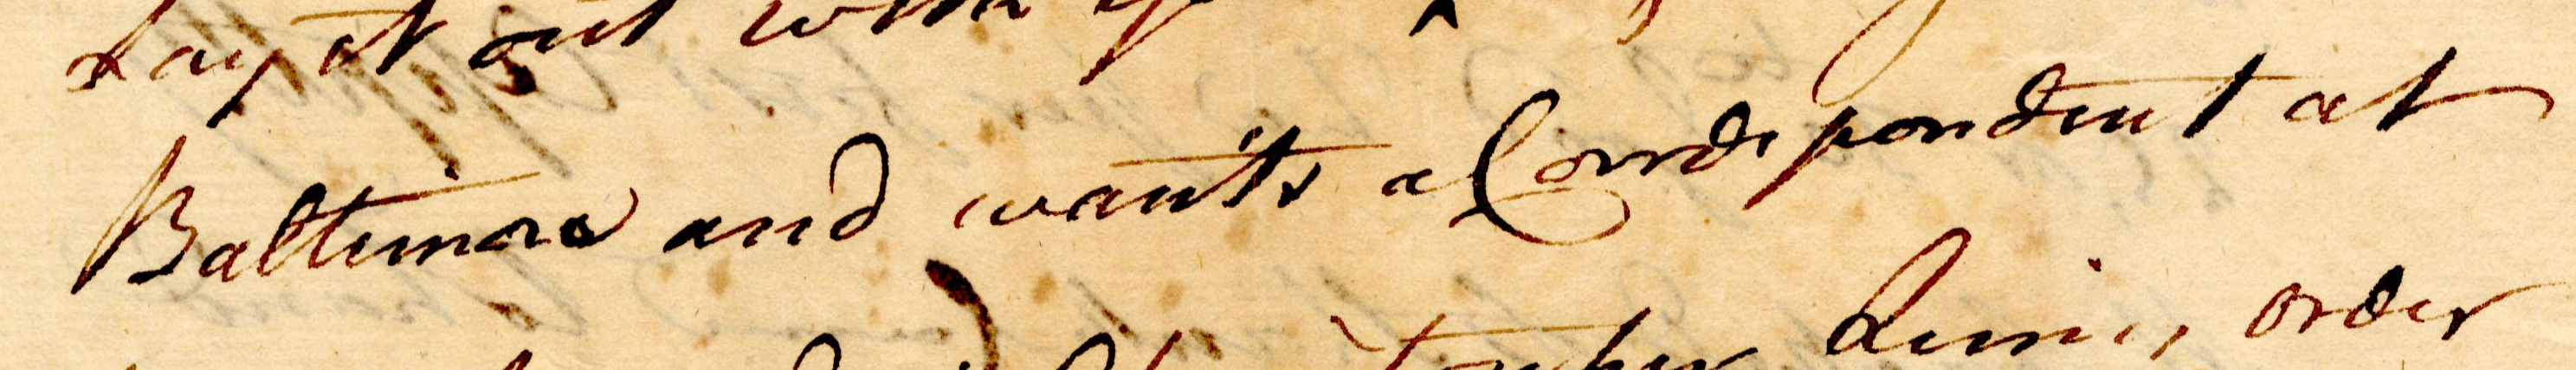Baltimore and wants a Correspondent at
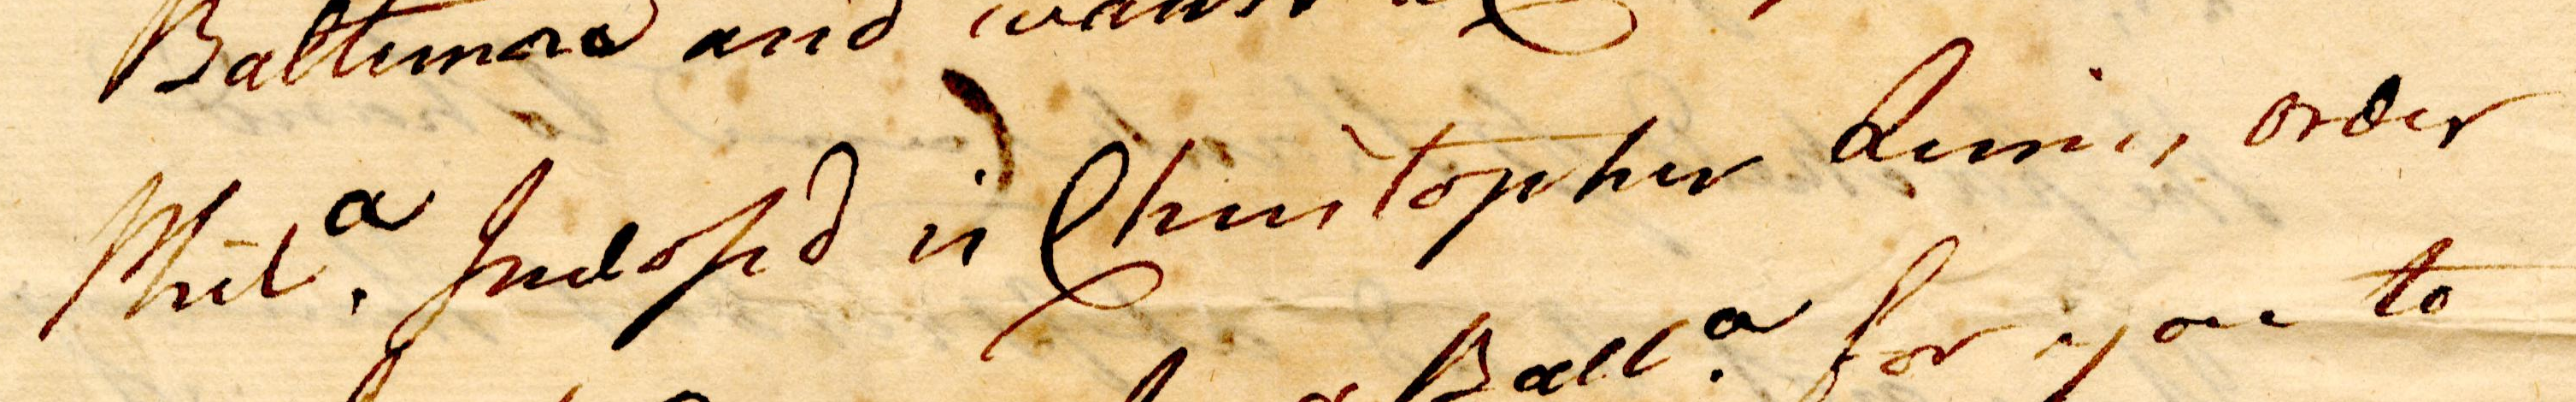Phil^a. Inclosd is Christopher Lewis order
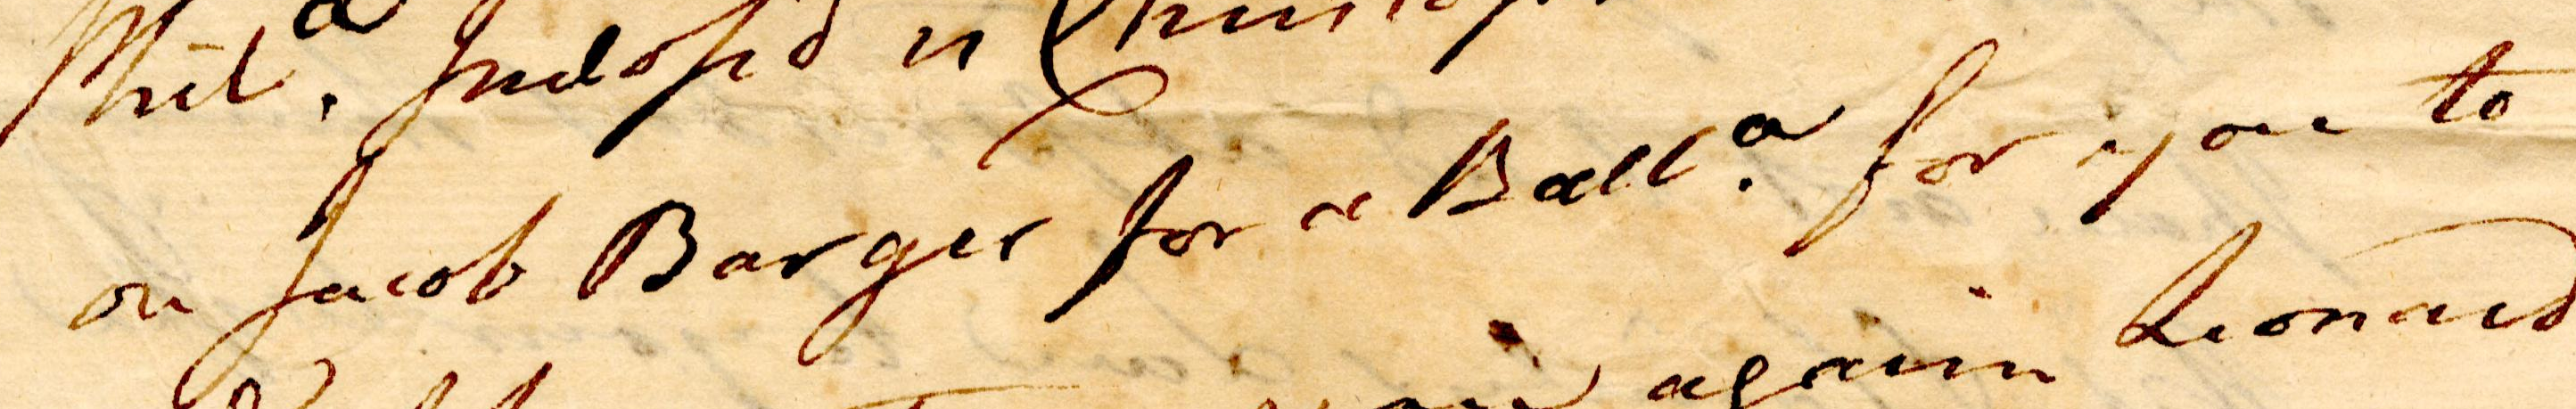on Jacob Barger for a Ball^ce for you to
